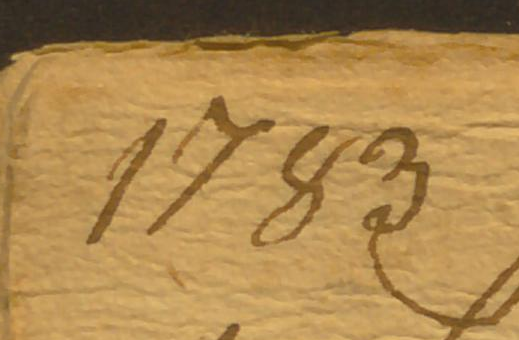1783
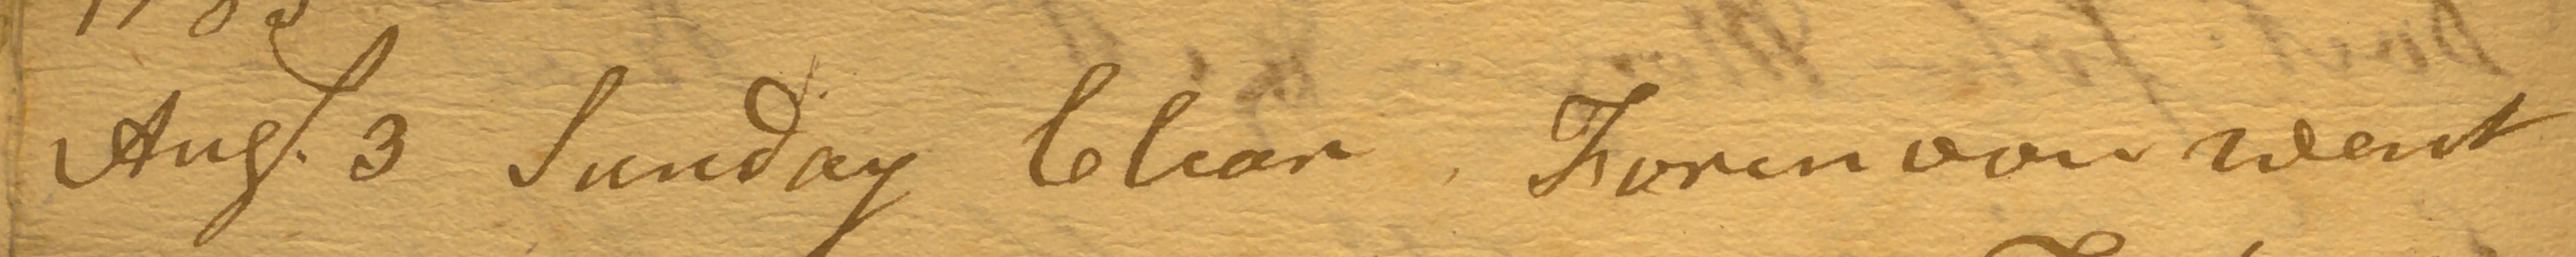Aug^t. 3 Sunday Clear Forenoon went
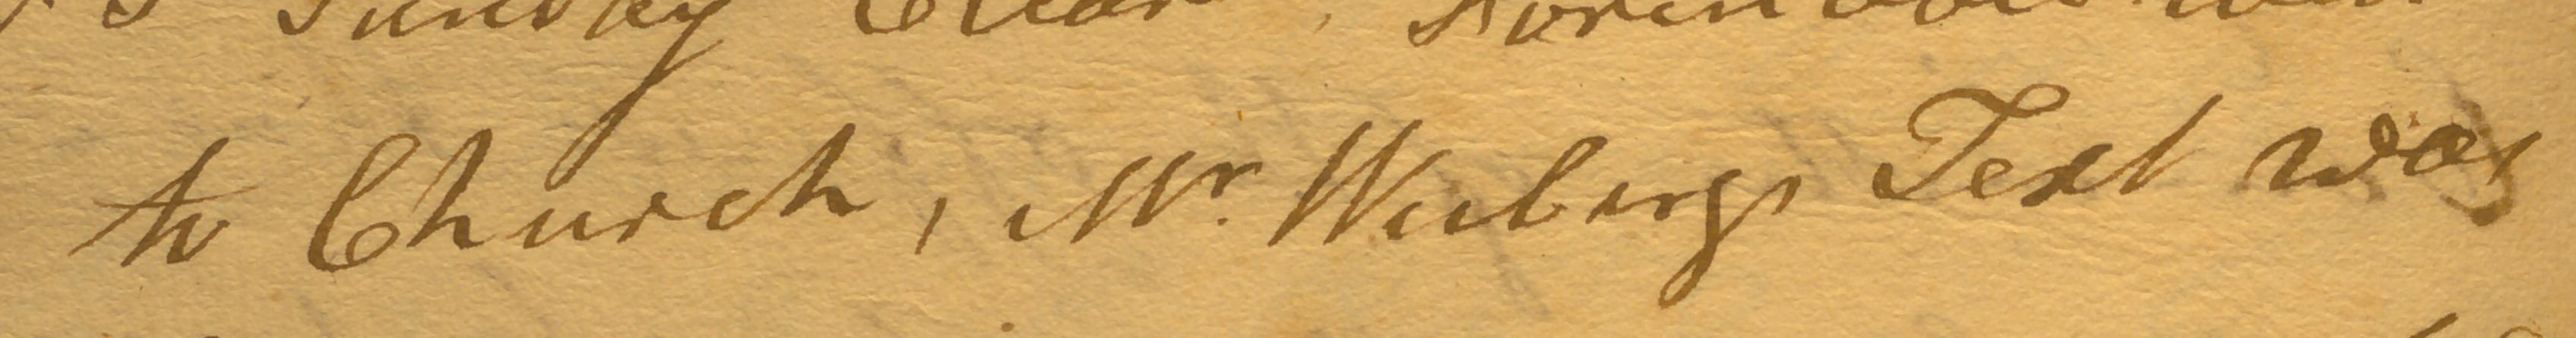to Church, M^r. Weiburgs Text was
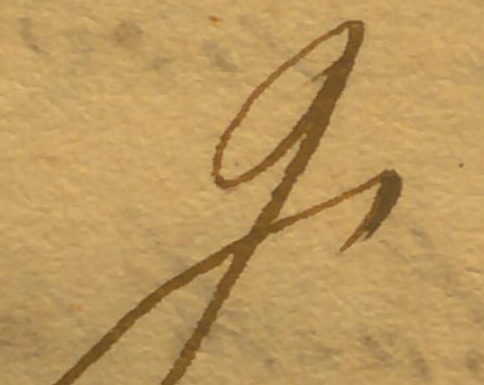Is
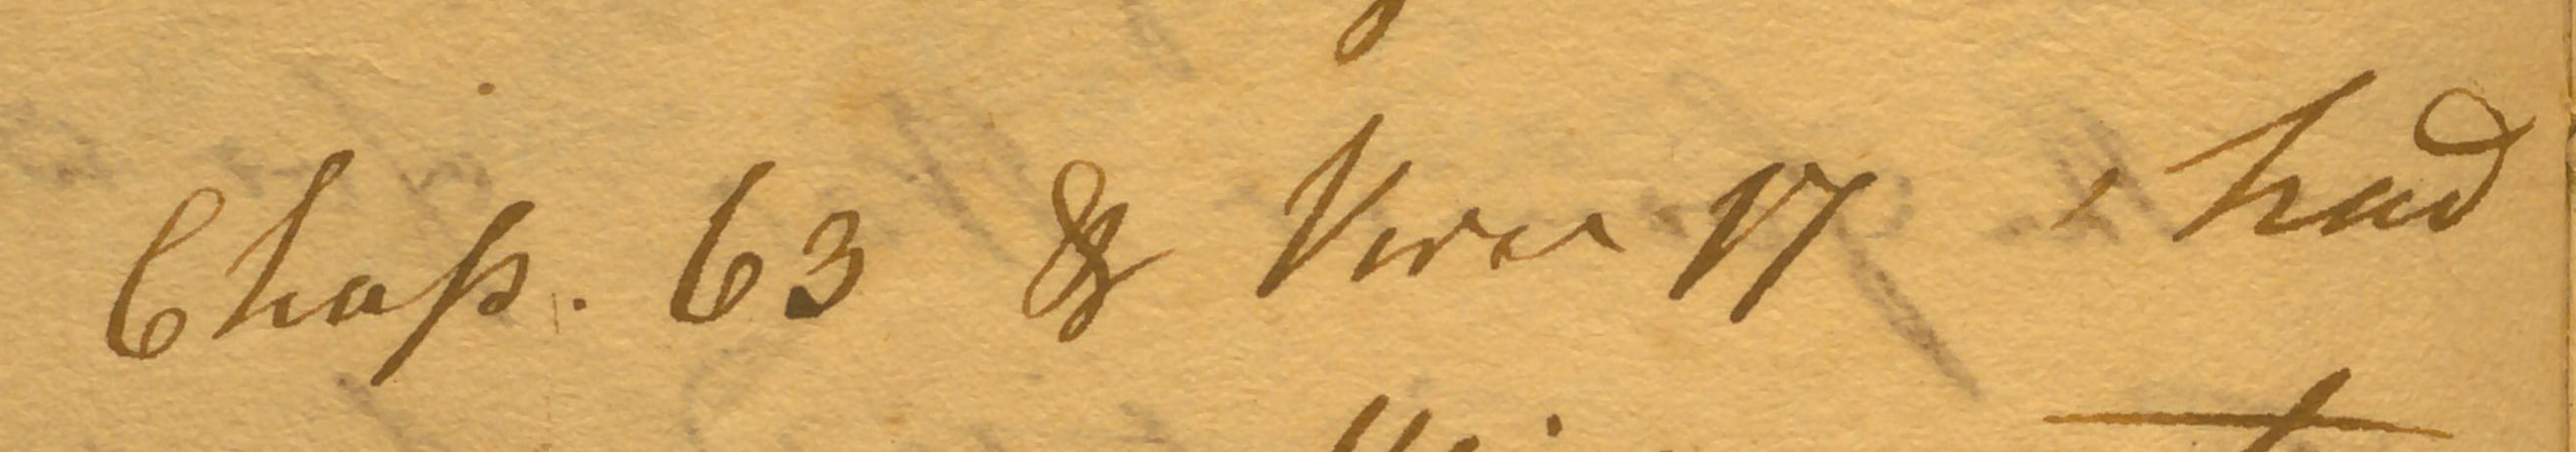Chap. 63 & Verne 17 had
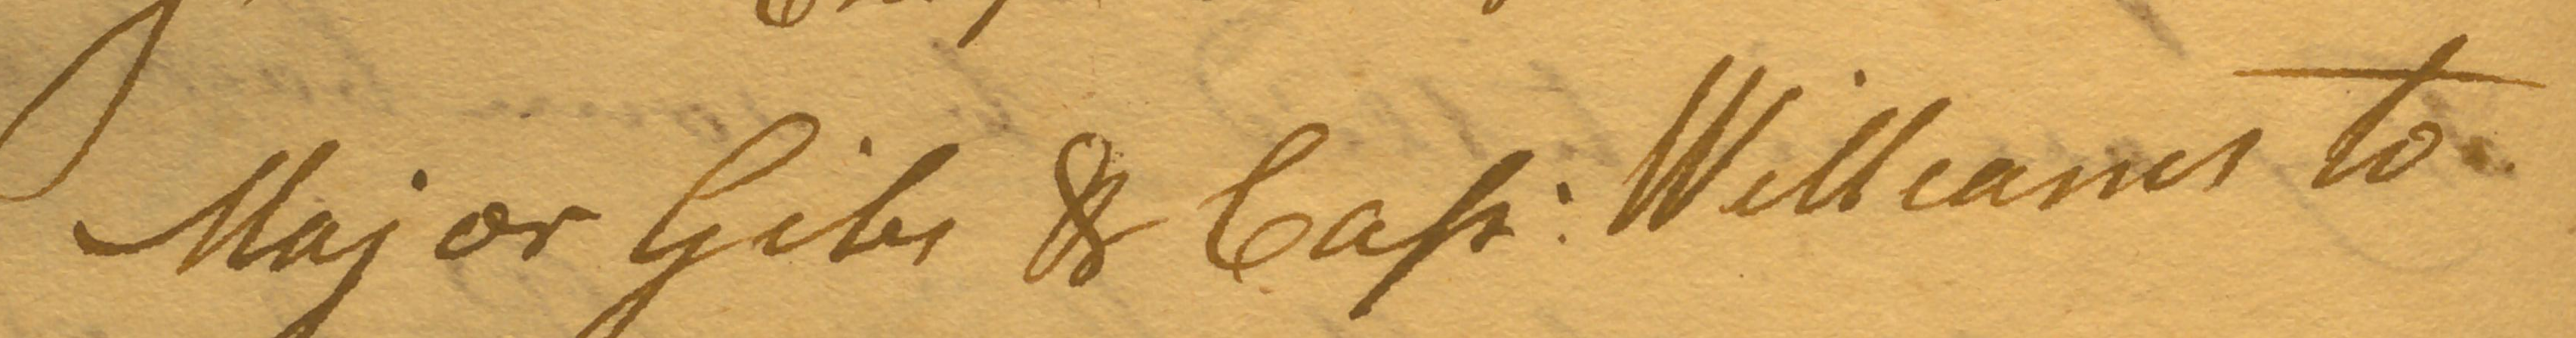Major Giles & Cap: Williames to
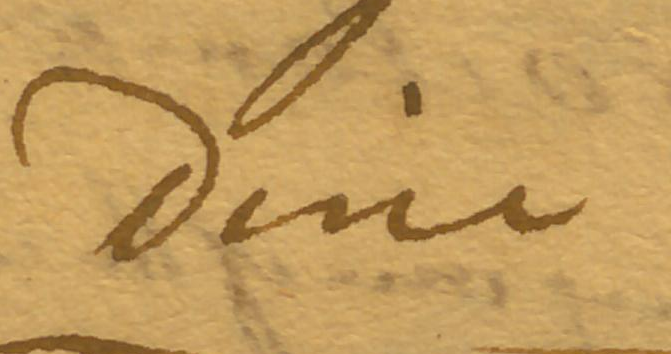dine
